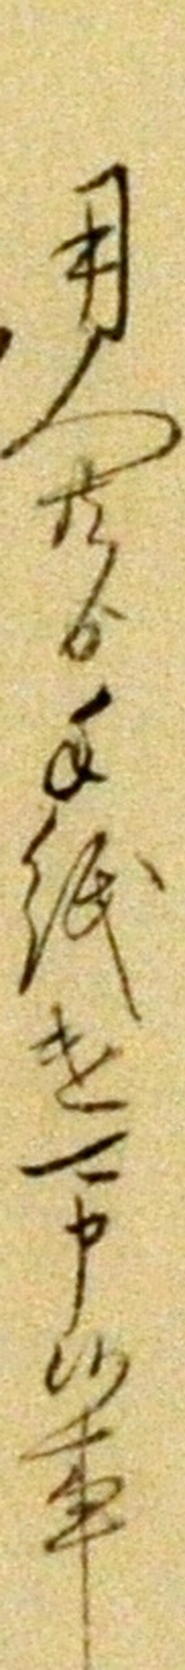用人共ゟ手紙遣可申候事
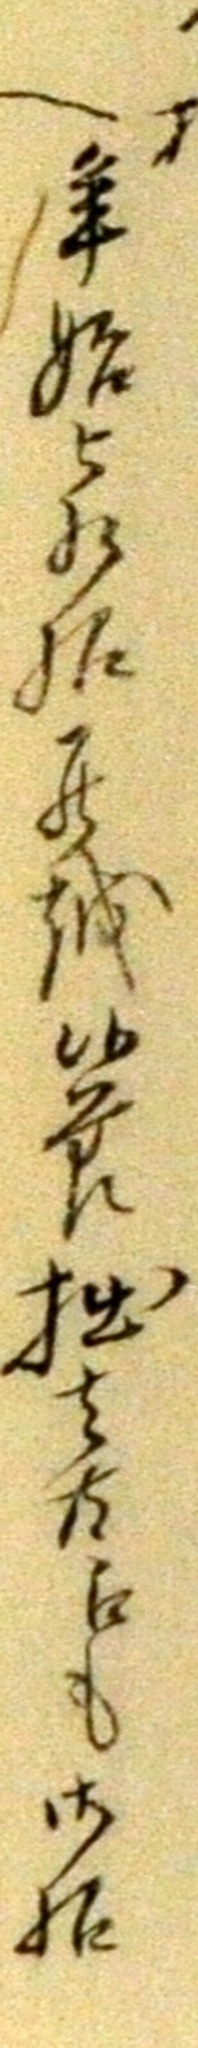年始被相招罷越候節拙者共江も御招

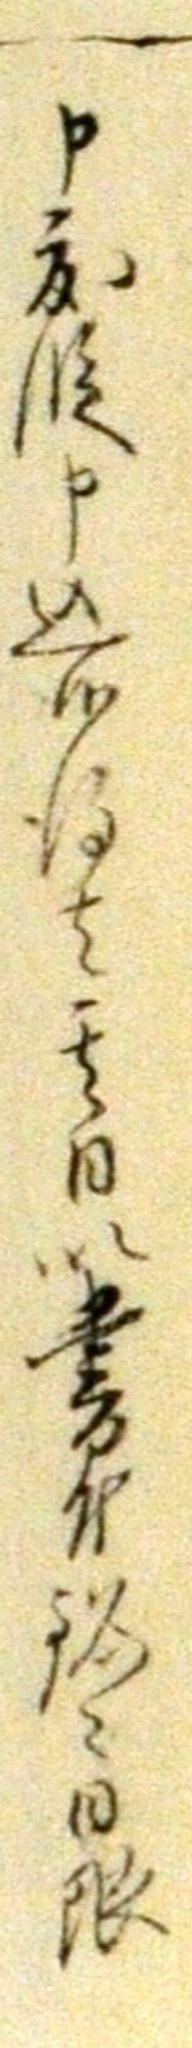申度段申込候得者其日以書付銘々日限
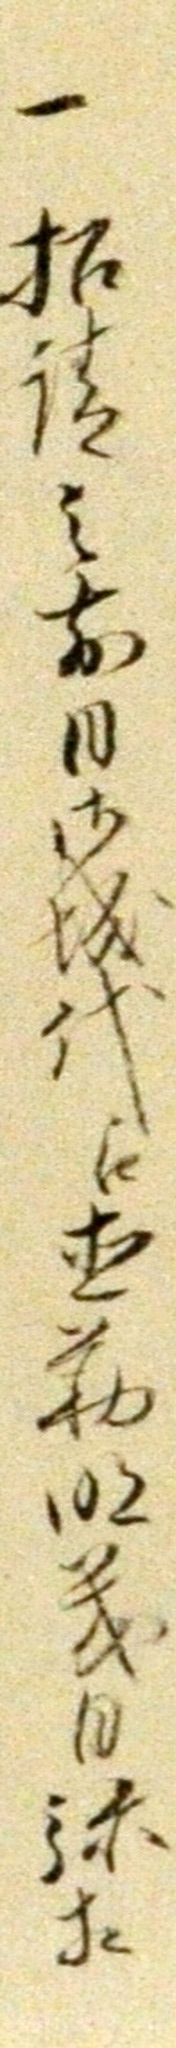一招請之前日御城代江直勤明幾日弥相
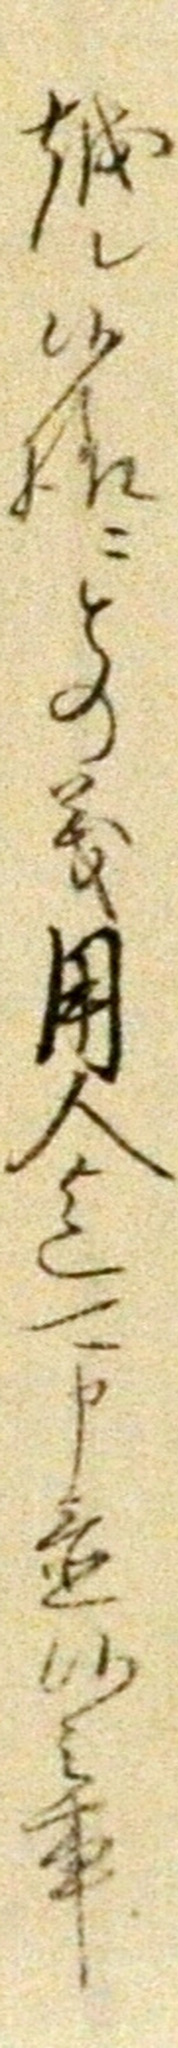越シ候様ニとの義用人迄可申置候之事
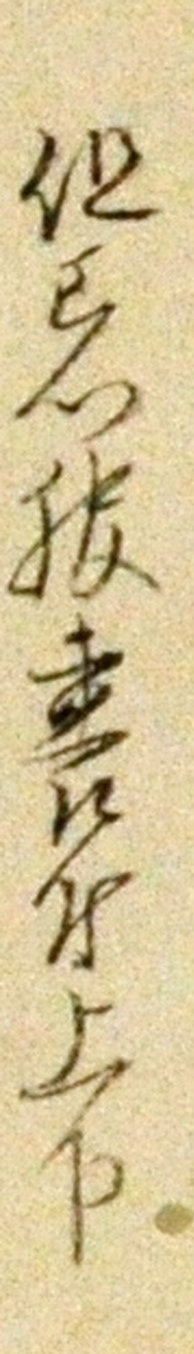但着服裏付上下
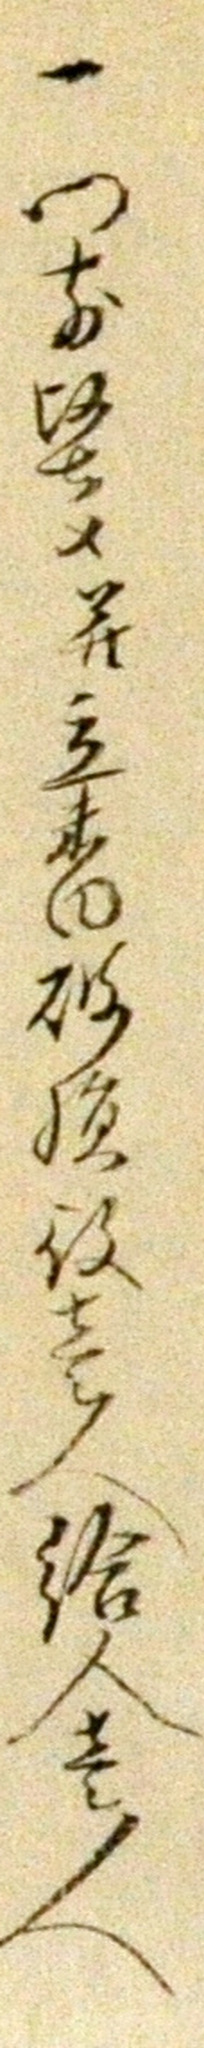一門前堅メ并立番破損役壱人給人壱人
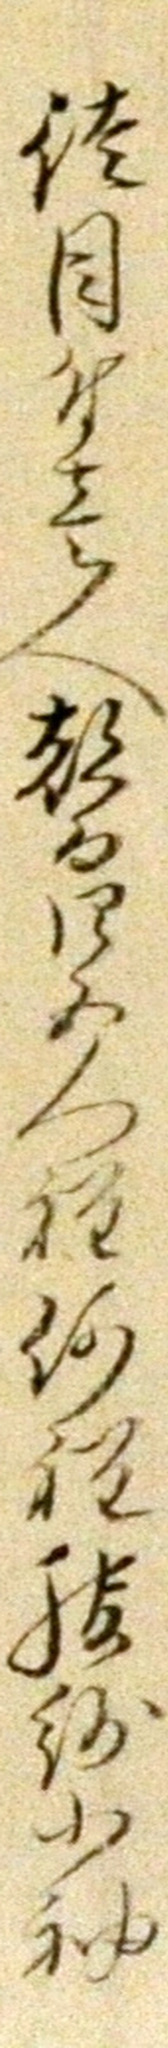徒目付壱人都而四五人程何程服紗小袖
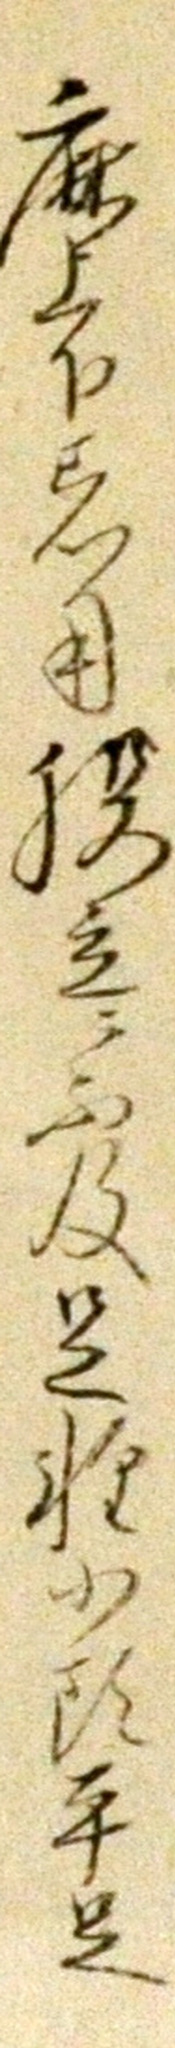麻上下着用股立ニ不及足軽小頭平足
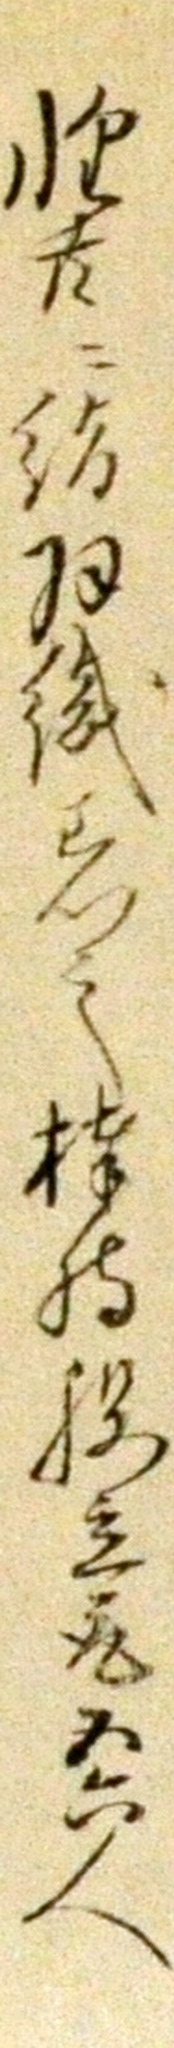軽共二絹羽織着之棒持股立取五六人
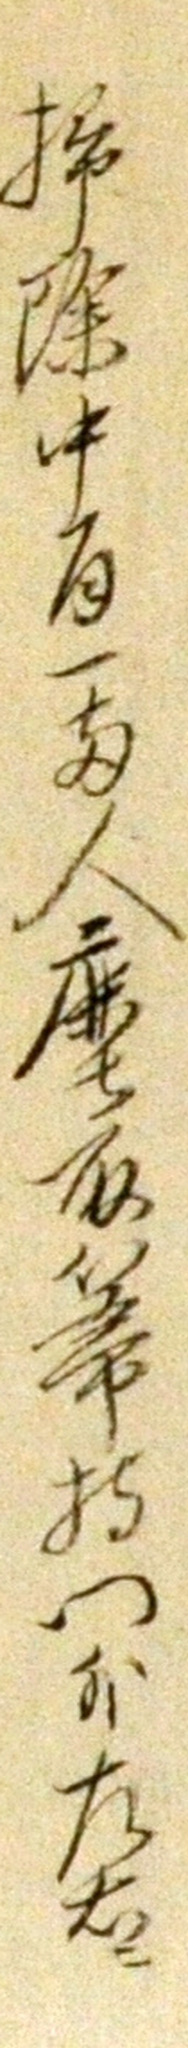掃除中間一両人塵取箒持門外左右ニ
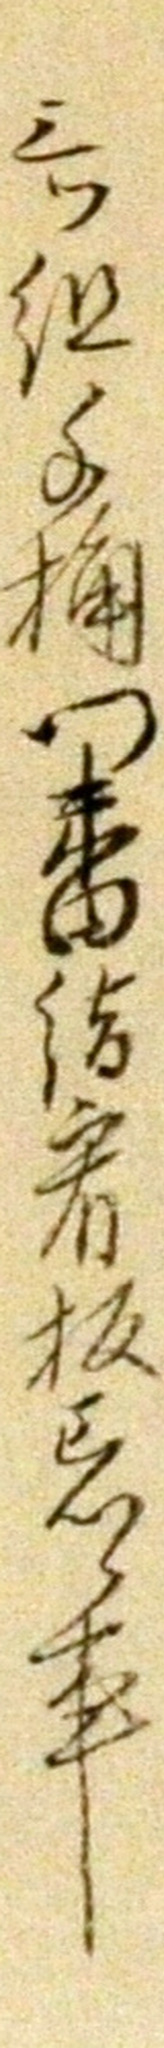三つ組手桶門番絹看板着候事
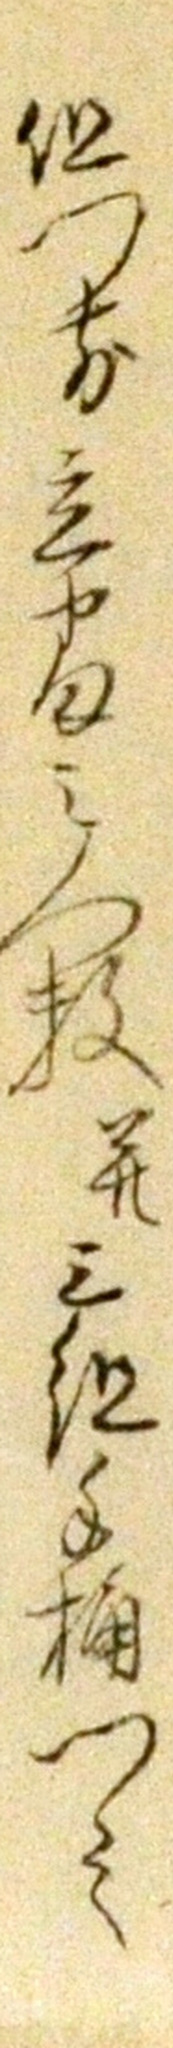但門前立番之人数并三組手桶門之
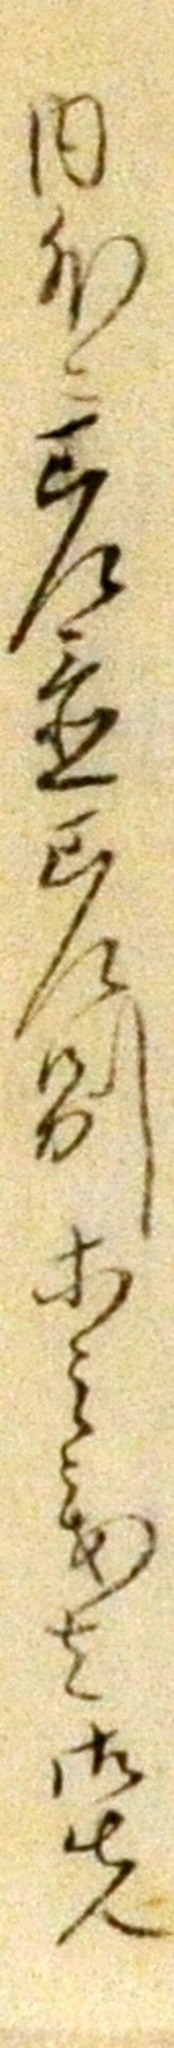内外ニ差置差別等之義者御先
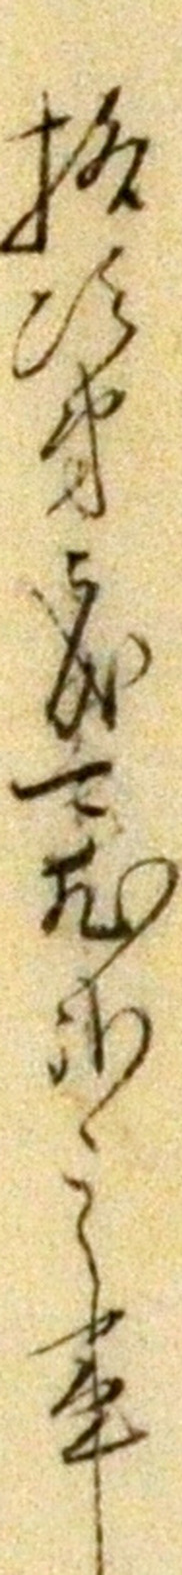格次第被成可然哉之事
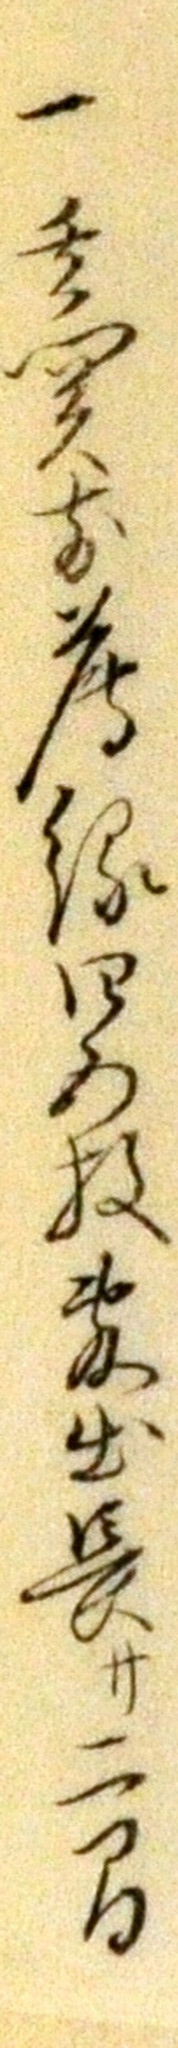一玄関前薄縁四五枚敷出長サ二間
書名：大阪加番関係諸書留〔一括〕
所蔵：伊那市立高遠町図書館・合同会社AMANE
